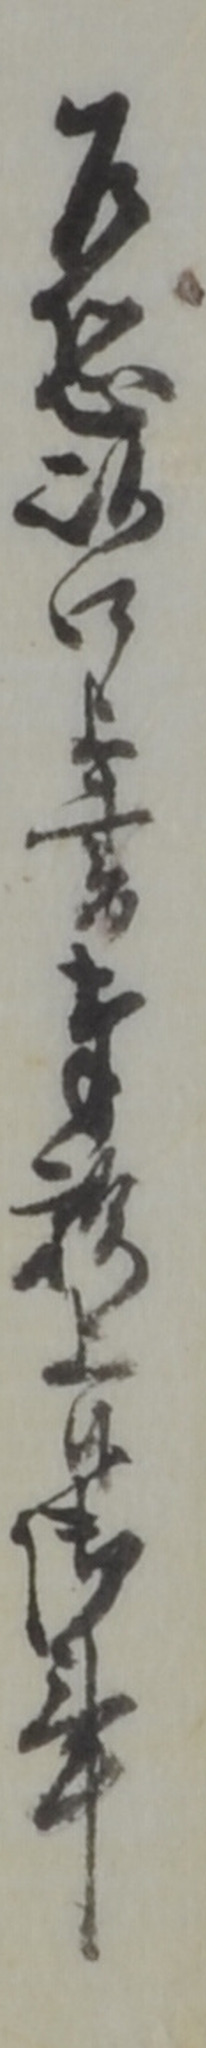乍恐以口上書奉願上候御事
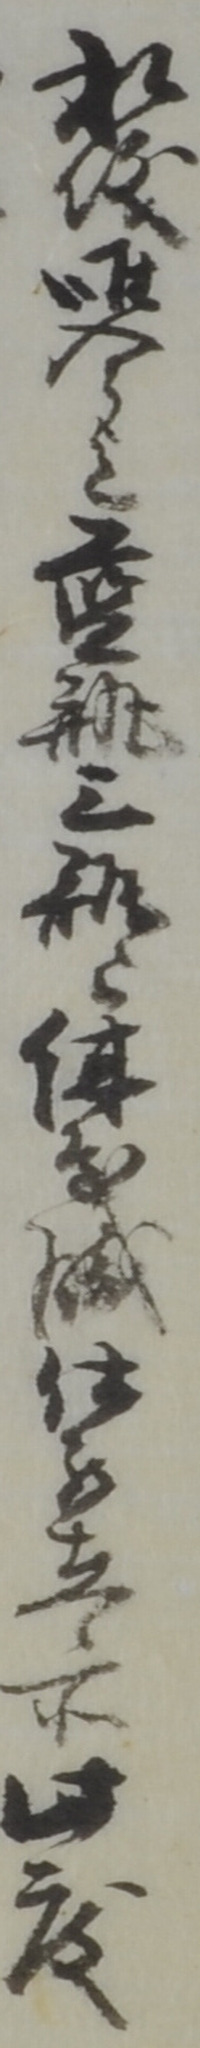私儀唯今迄藍瓶三瓶ニ而紺屋職仕罷在候所此度
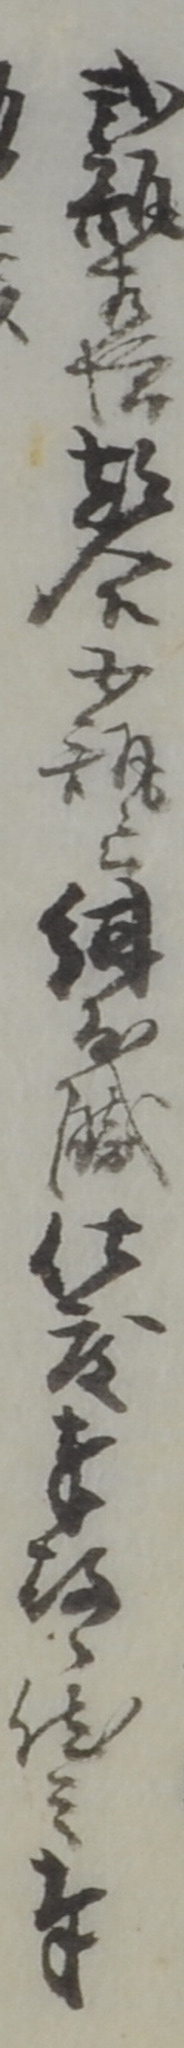弐瓶相増都合五瓶ニ而紺屋職仕度奉存候依之奉
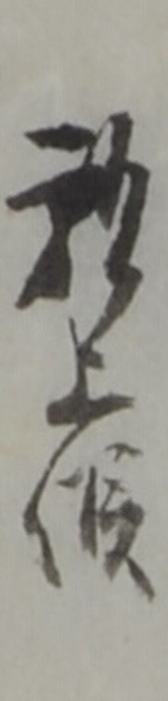願上候
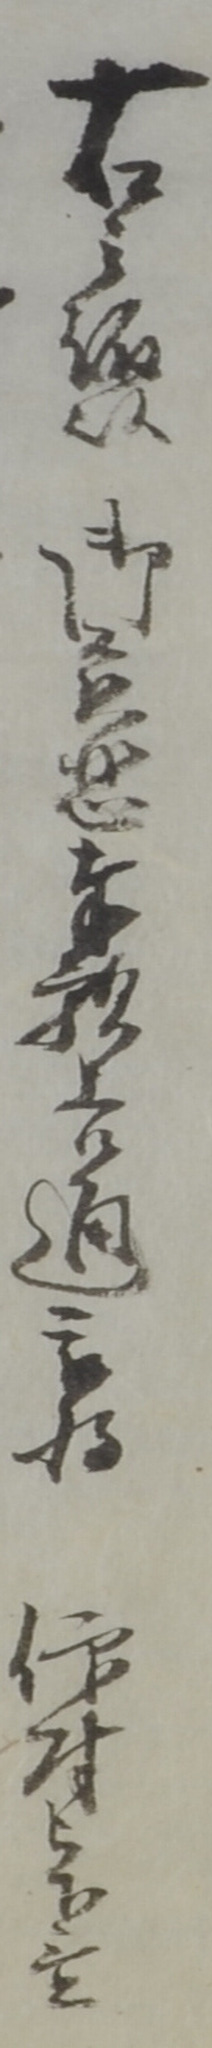右之趣以御慈悲奉願上候通被為仰付被下置
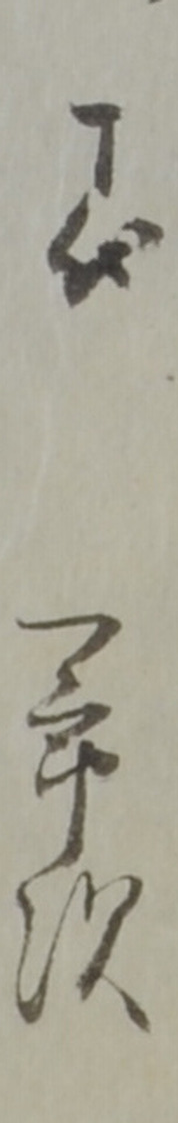丁代一郎次
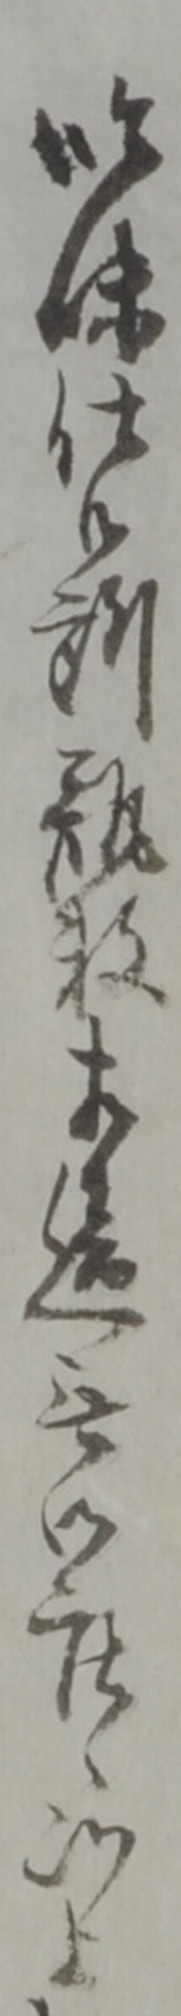吟味仕候所瓶数相違無御座候以上
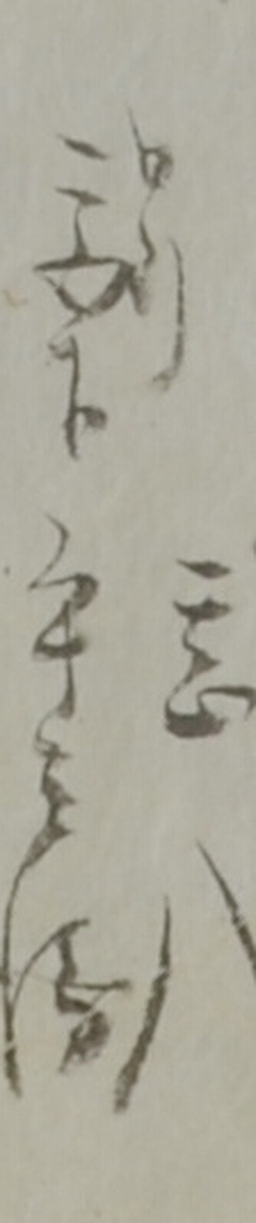高下午兵衛
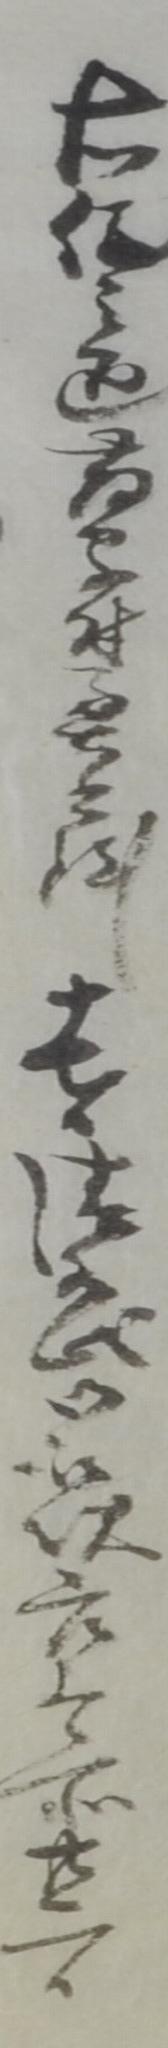右例之通苗字付奥書致し十七日清水氏御取次差上候所廿二日
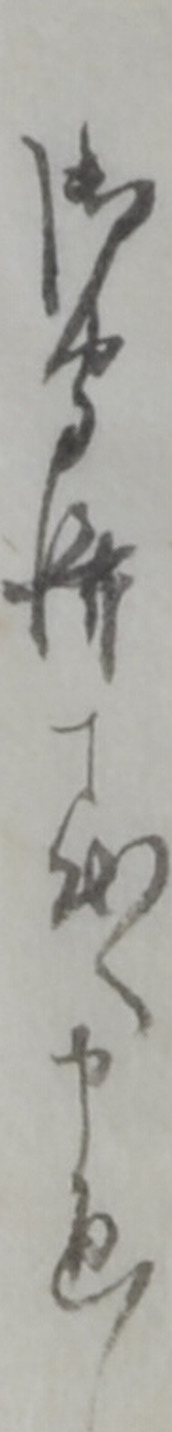御聞済丁代へ申通候

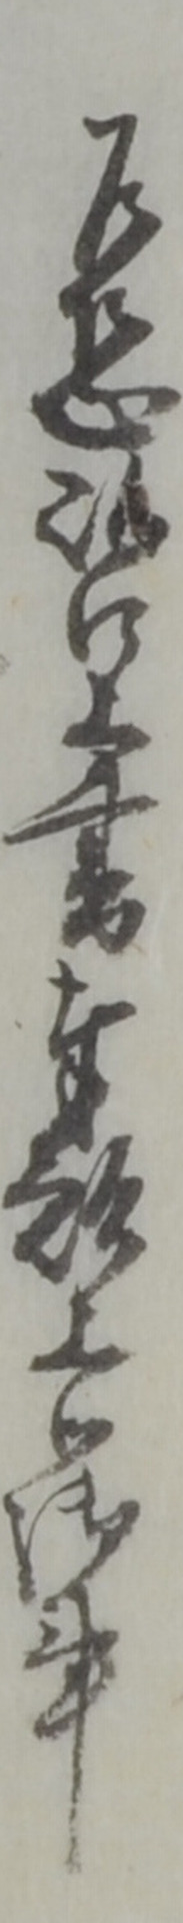乍恐以口上書奉願上候御事
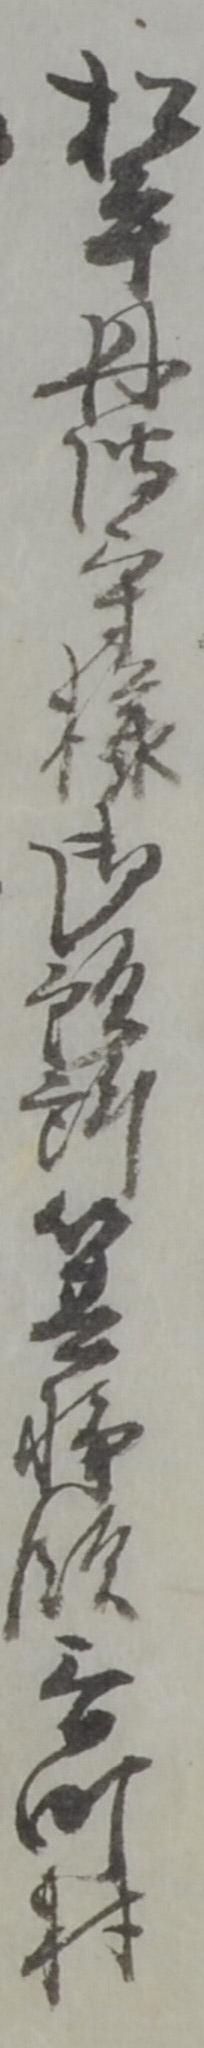松平丹波守様御預所箕輪領三日町村
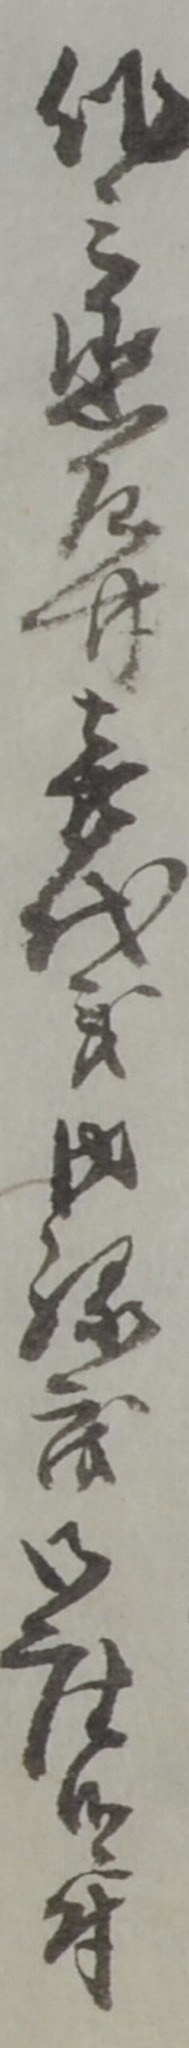作之丞厄介喜代義内縁も御座候ニ付
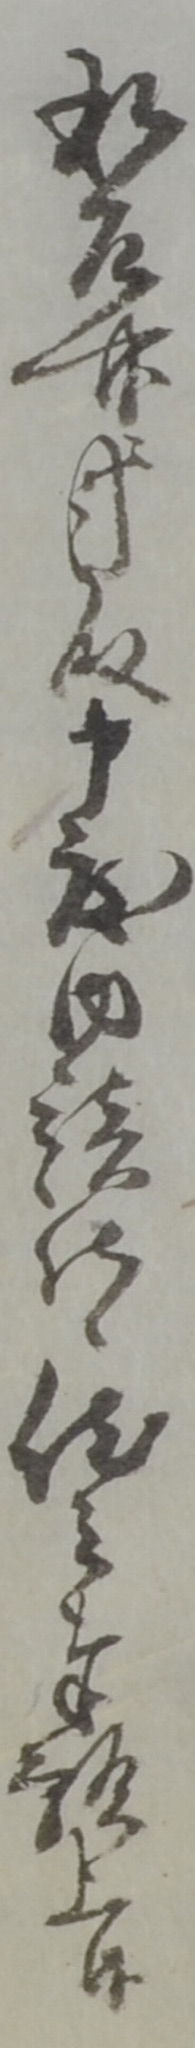私厄介ニ引取申度内談仕候依之奉願上候
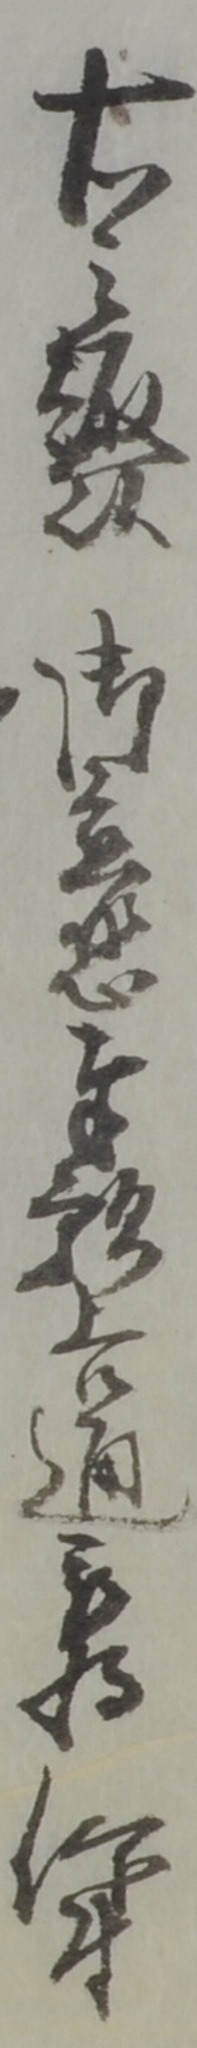右之趣以御慈悲奉願上候通被為仰付
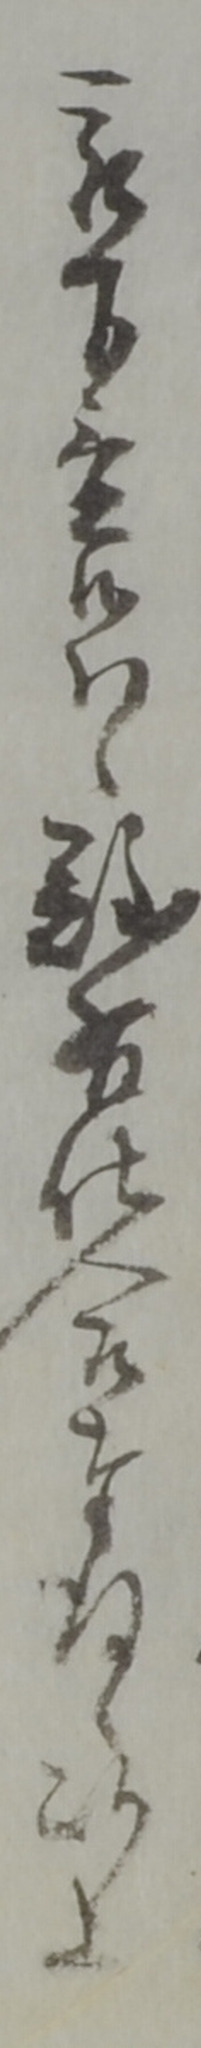被下置候ハヽ難有仕合奉存候以上
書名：諸願書控簿
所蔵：伊那市立高遠町図書館・合同会社AMANE
